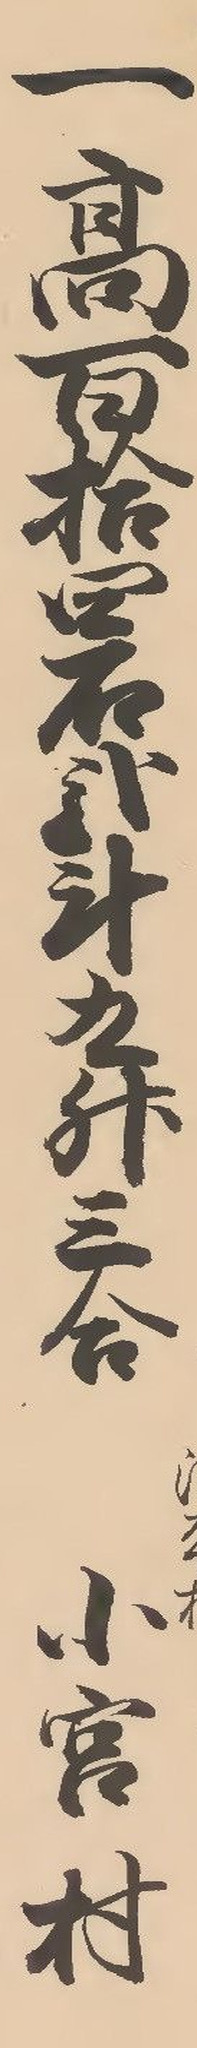一高百拾四石弐斗九升三合小宮村
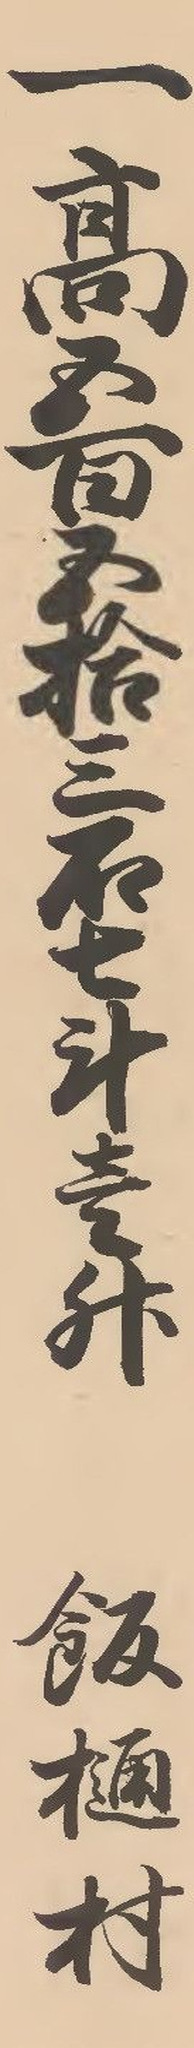一高五百五拾三石七斗壱升飯樋村
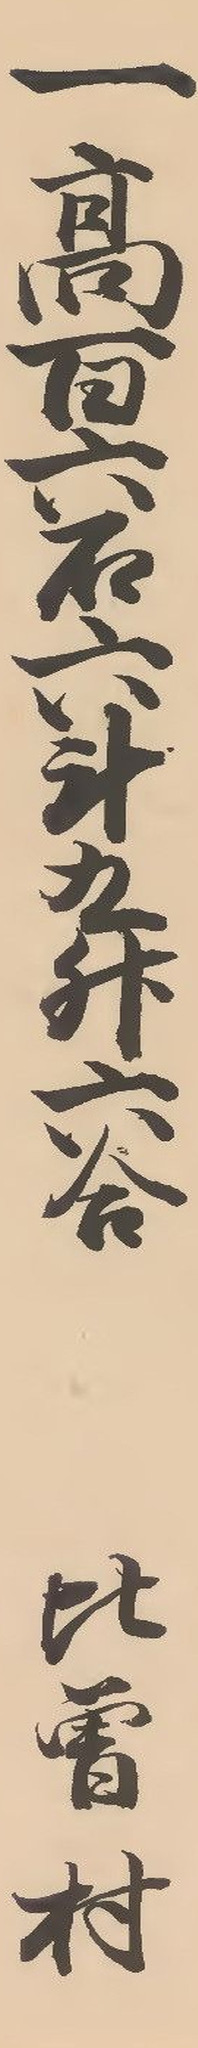一高百六石六斗九升六合比曽村
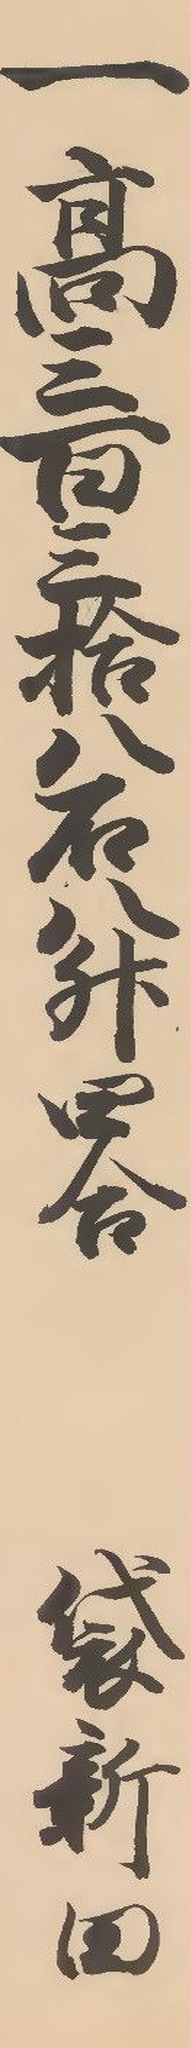一高三百三拾八石八升四合袋新田
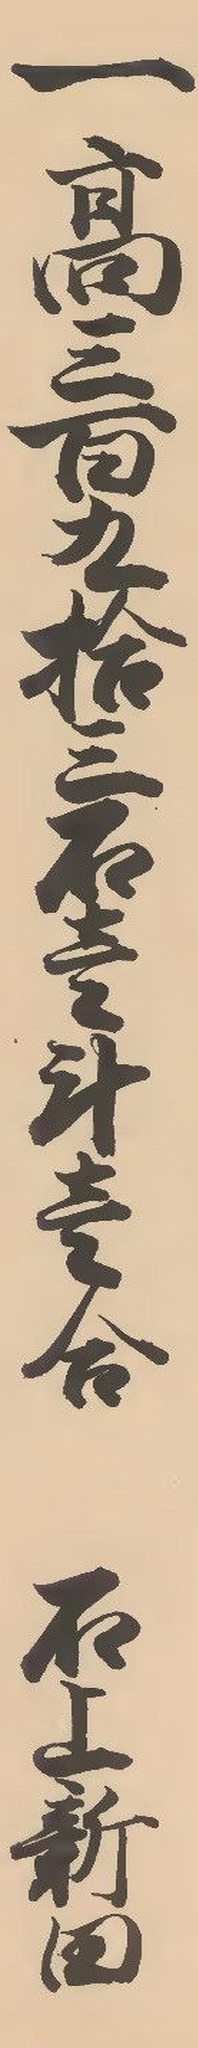一高三百九拾三石壱斗壱合石上新田
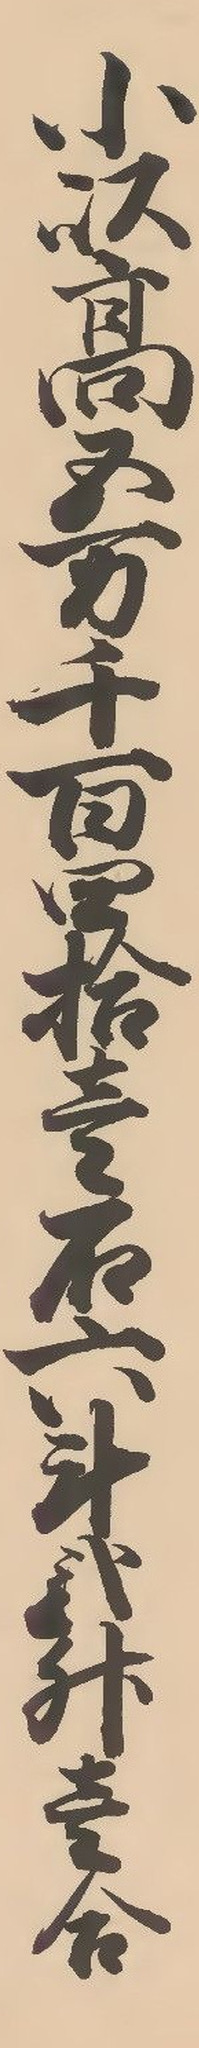小以高五万千百四拾壱石六斗弐升壱合

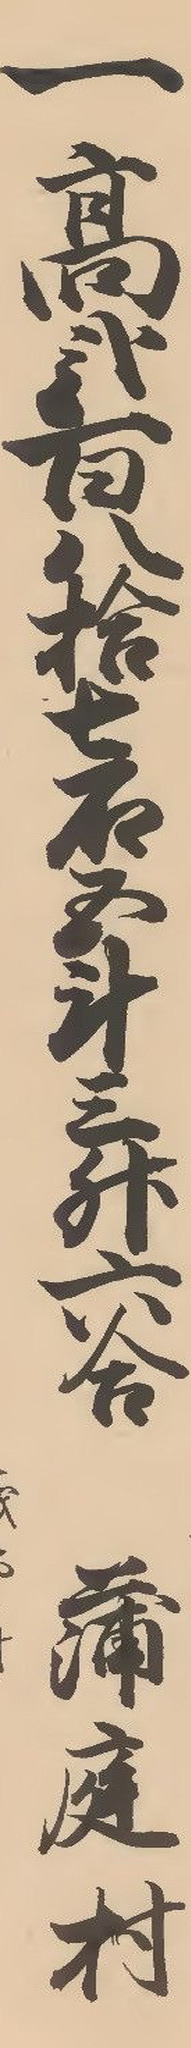一高弐百八拾七石五斗三升六合蒲庭村
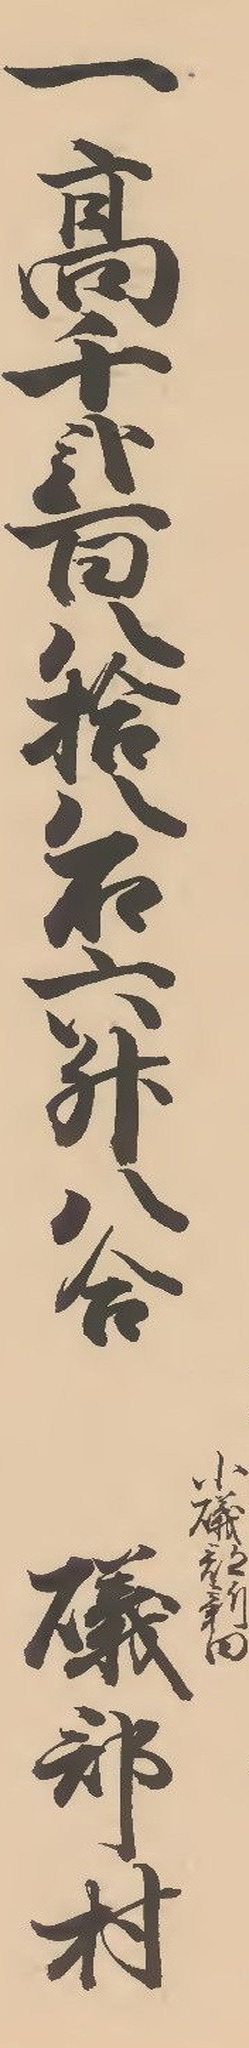一高千弐百八拾八石六升八合磯部村
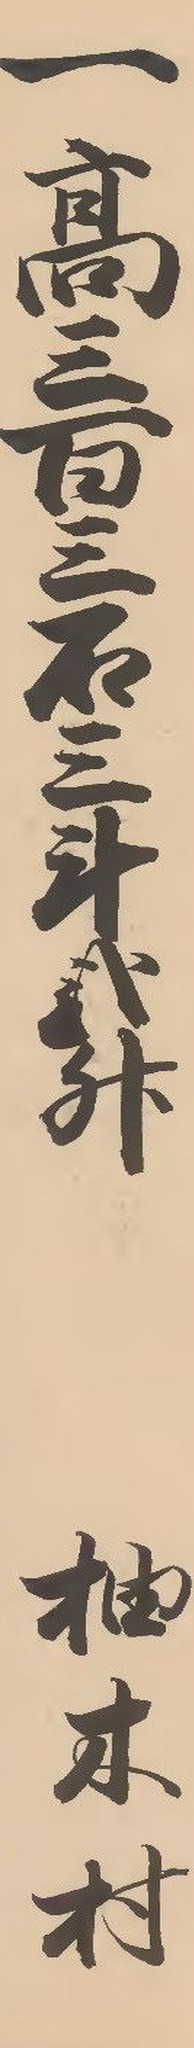一高三百三石三斗弐升柚木村
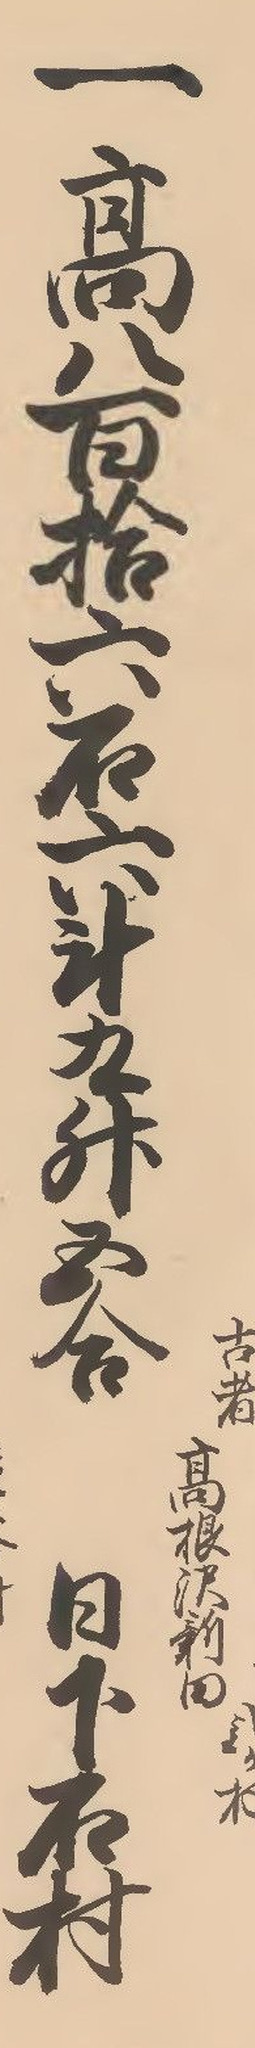一高八百拾六石六斗九升五合日下石村
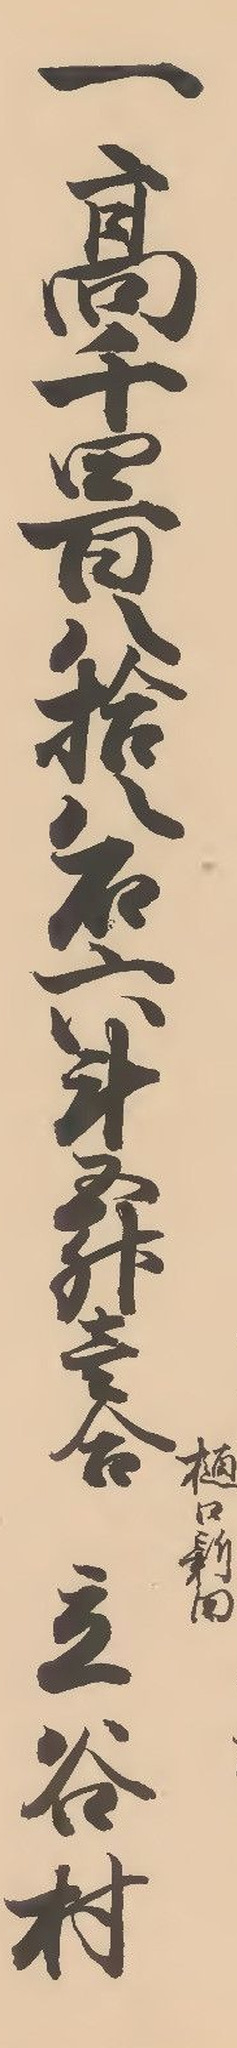一高千四百八拾八石六斗五升壱合立谷村
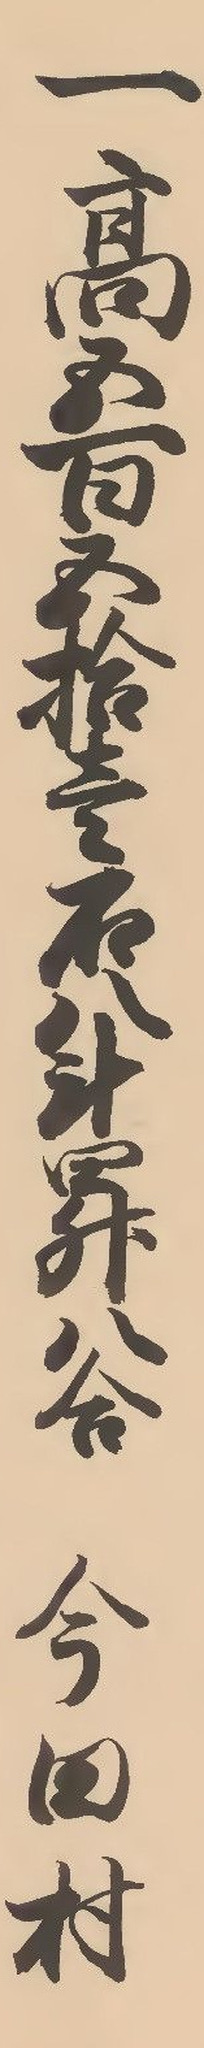一高五百五拾壱石八斗四升八合今田村
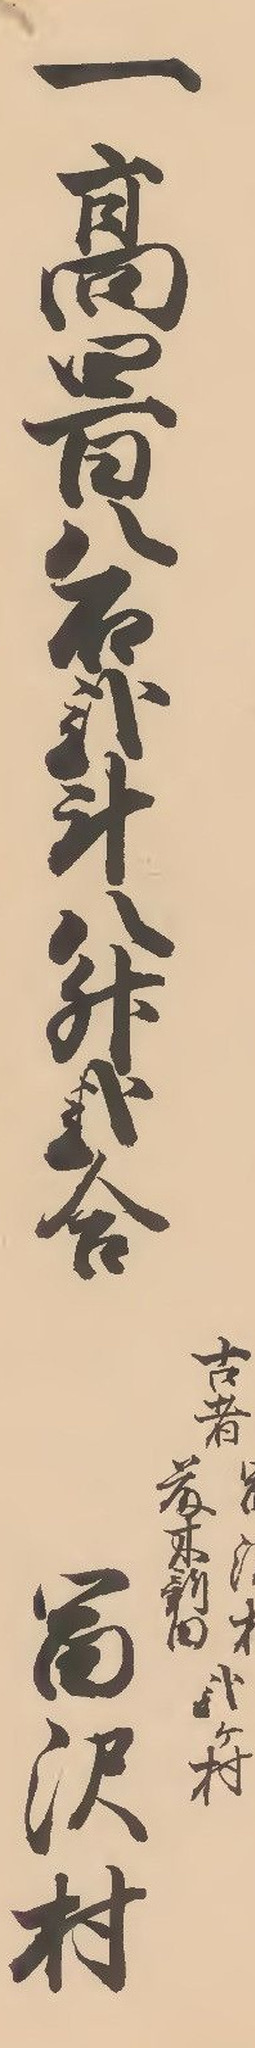一高四百八石弐斗八升弐合富沢村

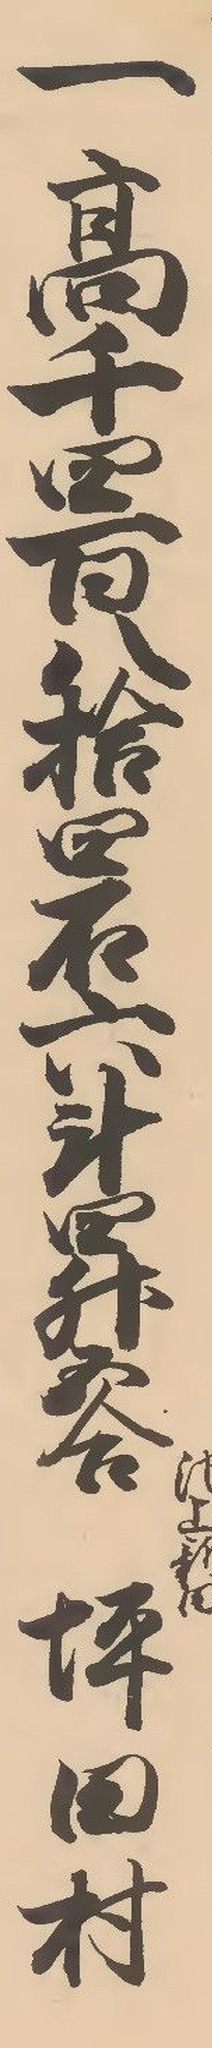一高千四百八拾四石六斗四升五合坪田村
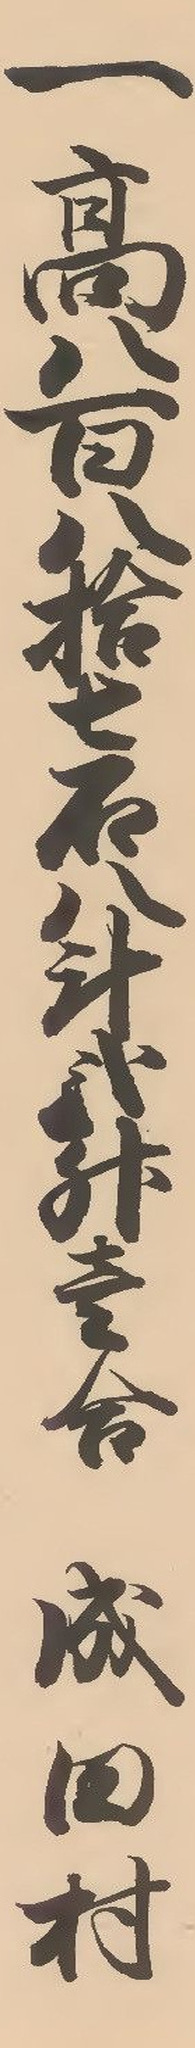一高八百八拾七石八斗弐升壱合成田村
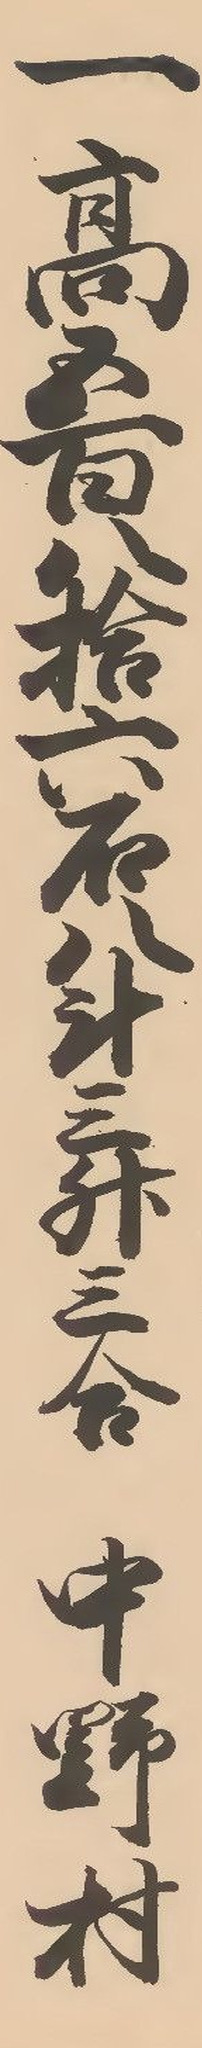一高五百八拾六石八斗三升三合中野村
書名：陸奥国郷帳　３
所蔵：国立公文書館 National Archives of Japan
